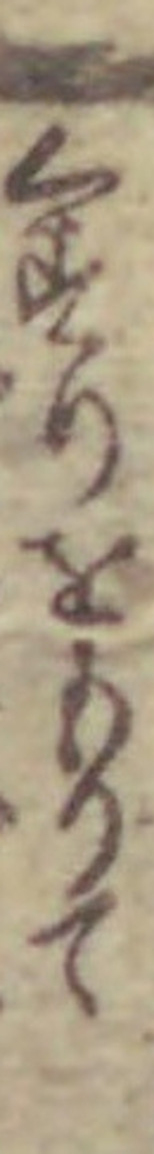くすりをもりて
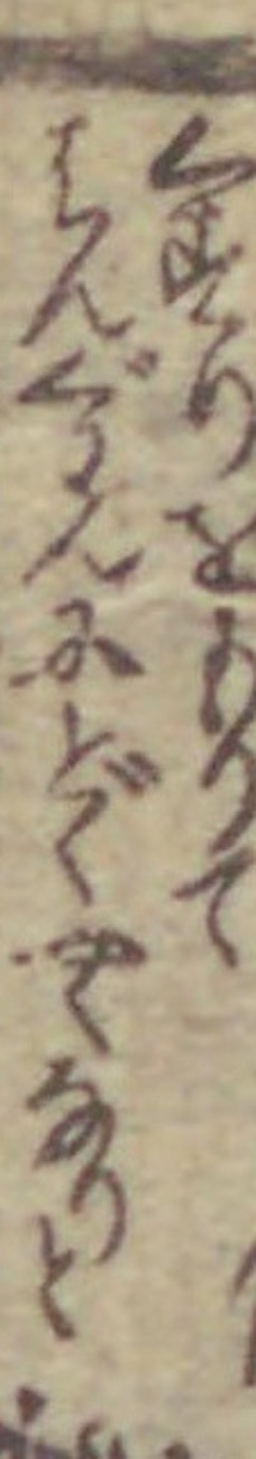はんぐわんにどくやくなりと
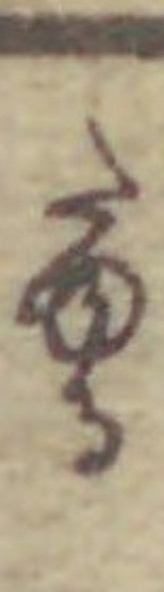たゆる
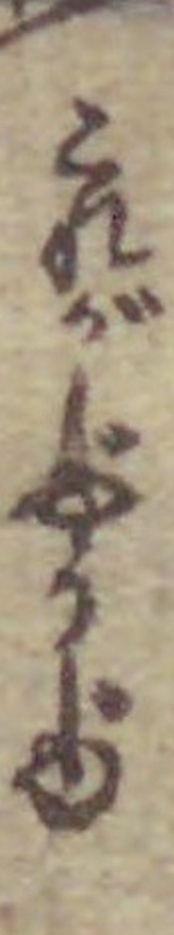これがじやうじゆ
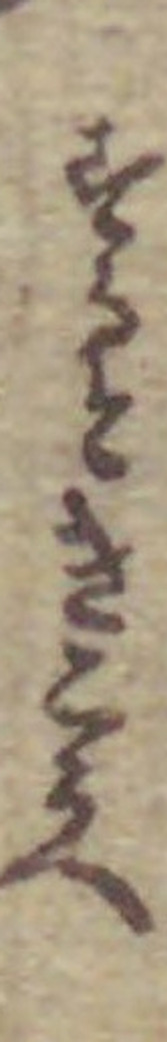するときこうへ
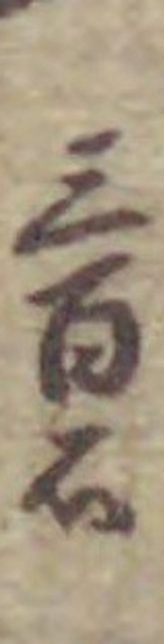三百石
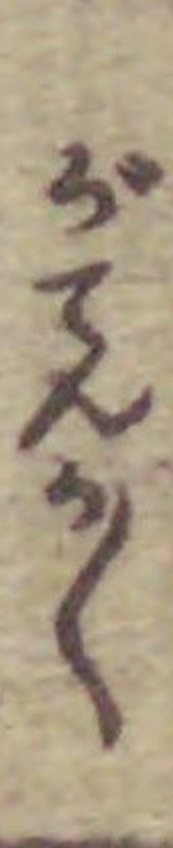がてんか〳〵
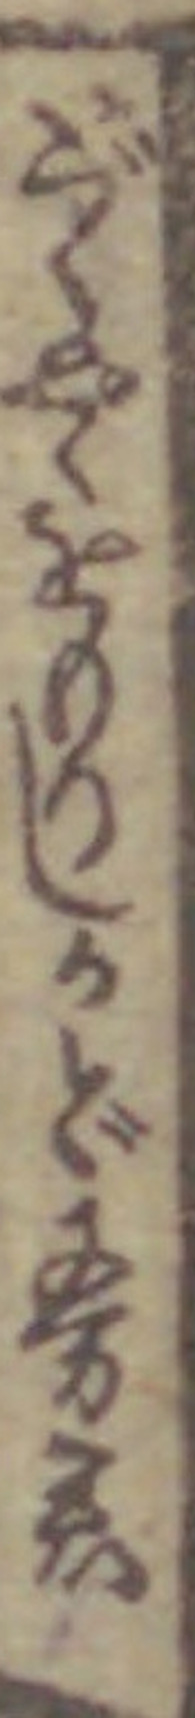どくやくをもりしかど千万君
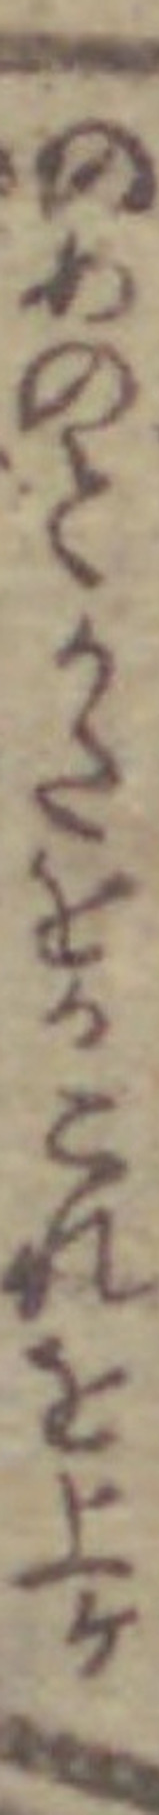のめのとかたをかこれを上ケ
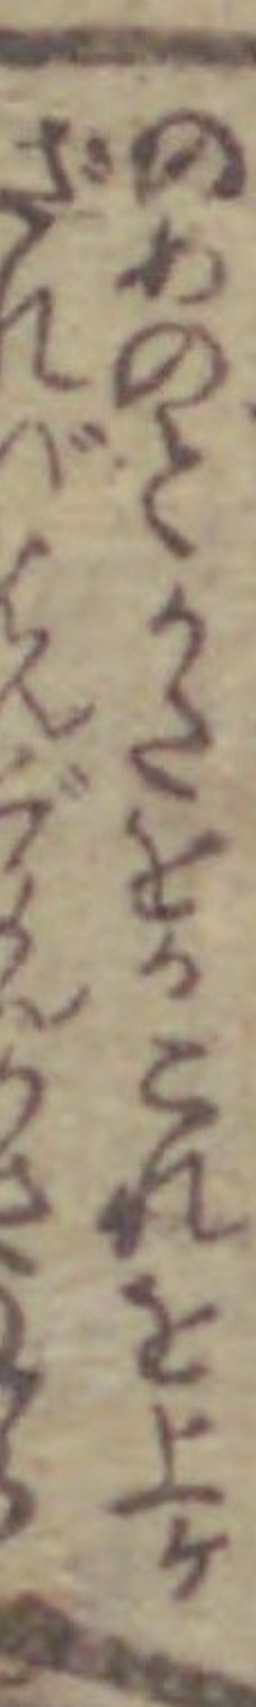ざればはんぐわんかさわら
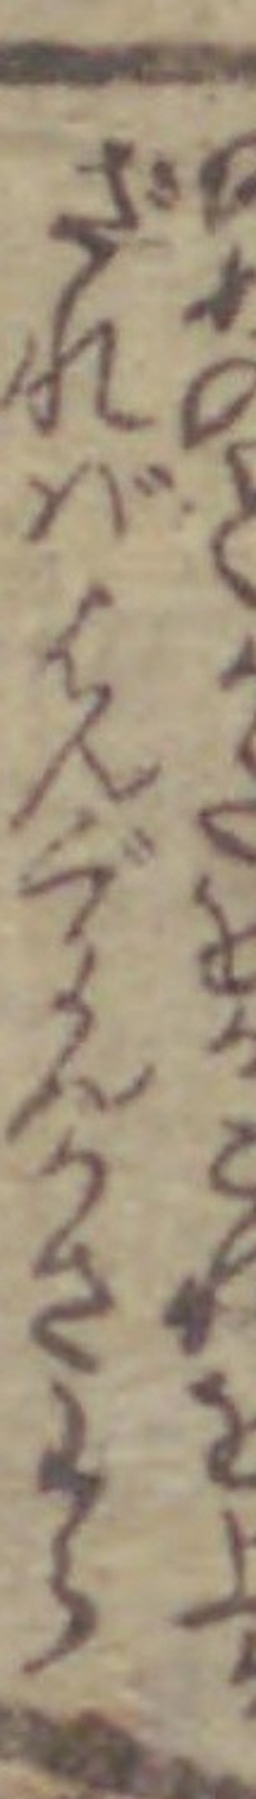ざればはんぐわんかさわら
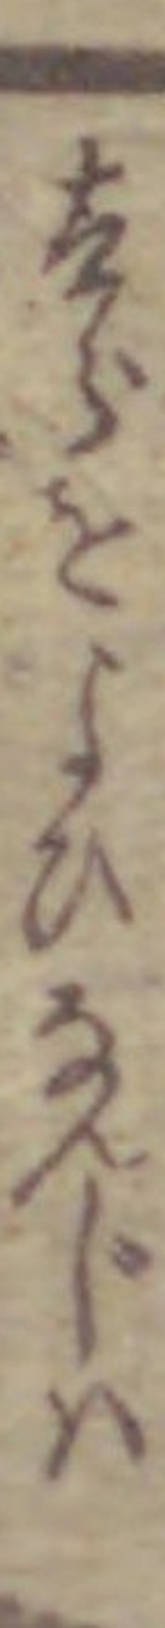太郎をよひなんじは
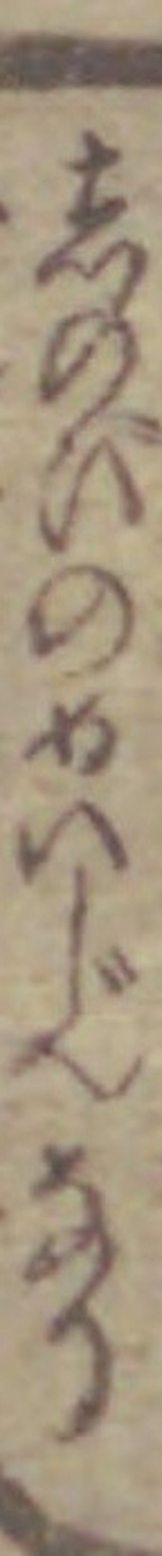しのびのめいじんなり
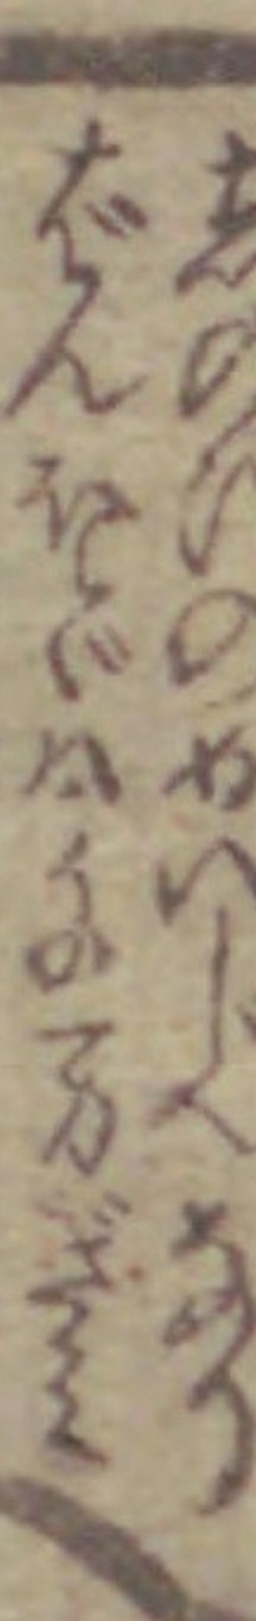ばんほどは千万ぎみ
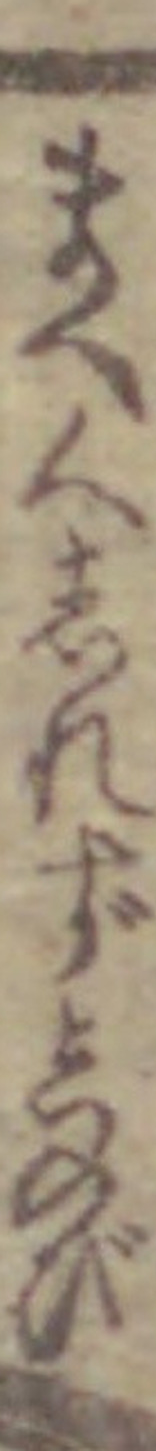まへ人しれずしのび
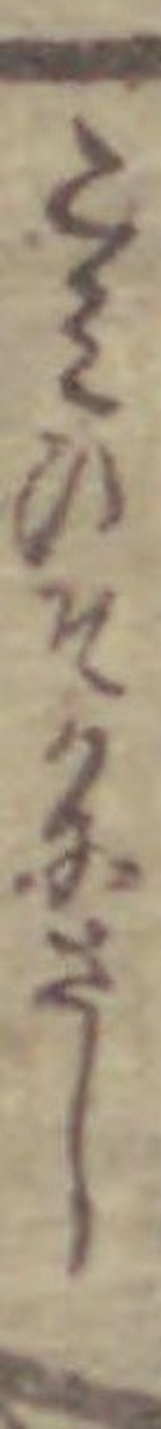こみひそかにさし
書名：鎌倉山紅葉浮名
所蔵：国立国会図書館 National Diet Library, JAPAN
